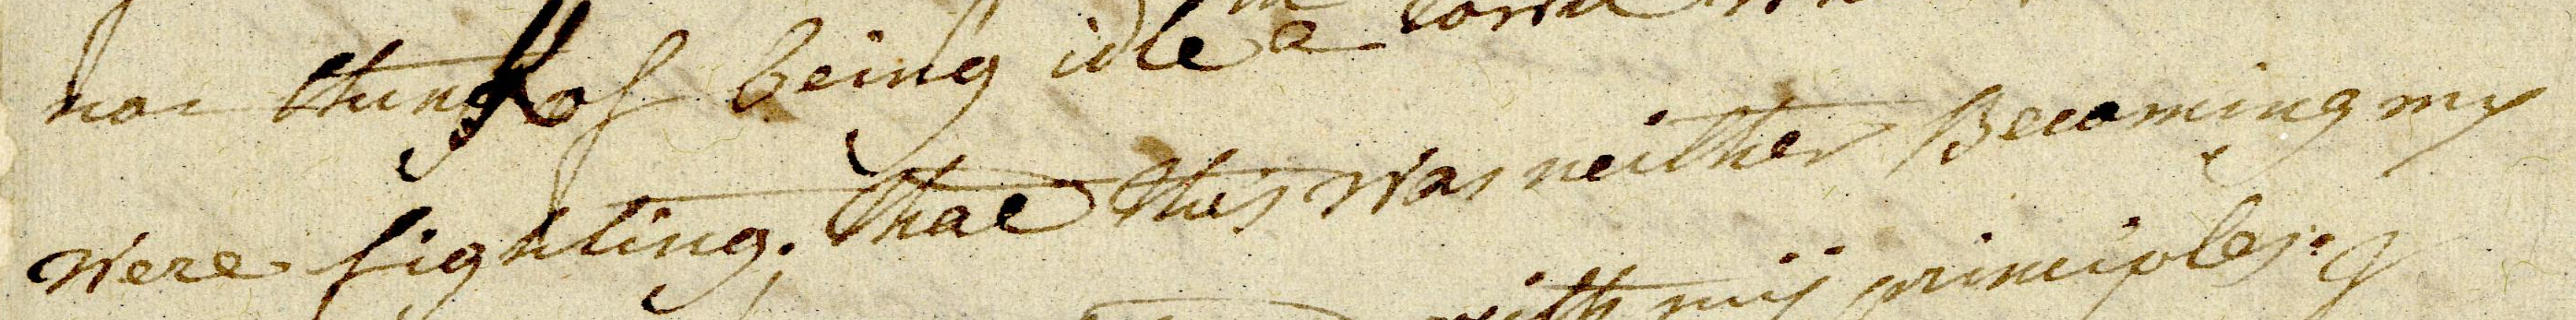were fighting. that this was neither Becoming my
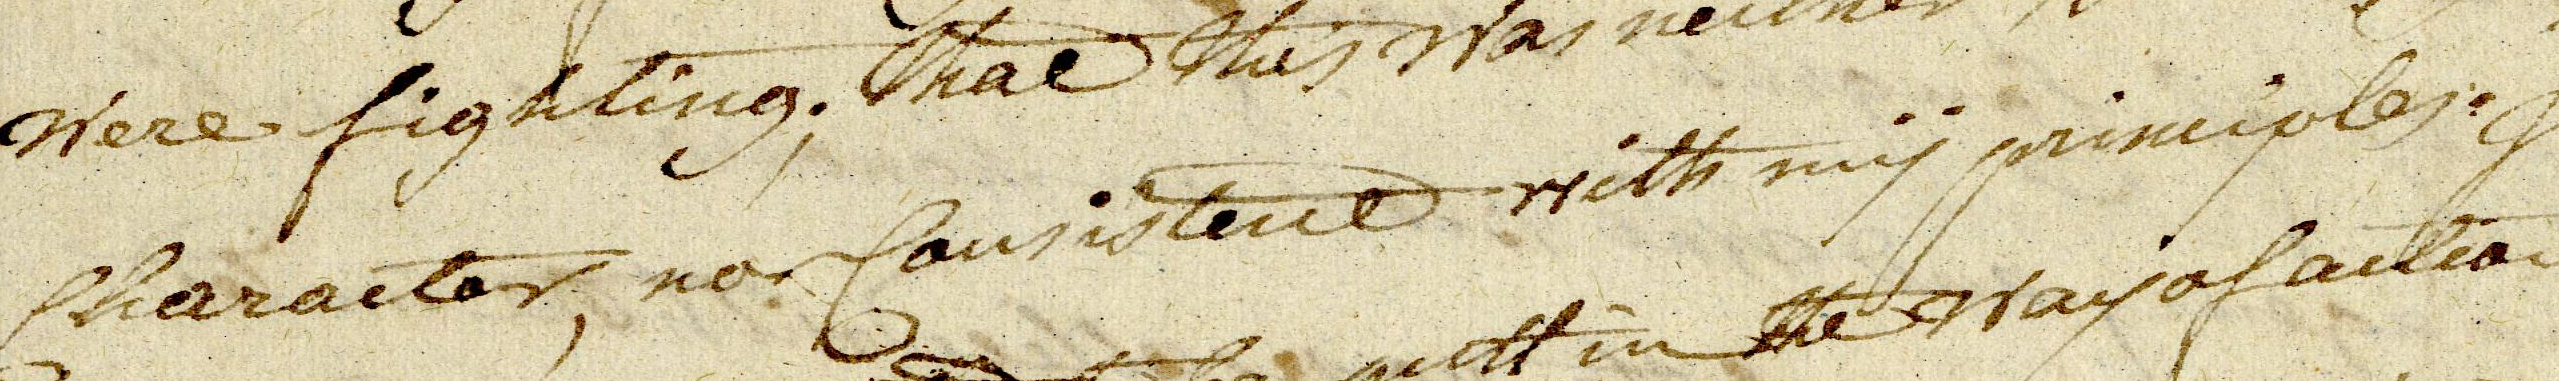Character no Consistence with my principles I
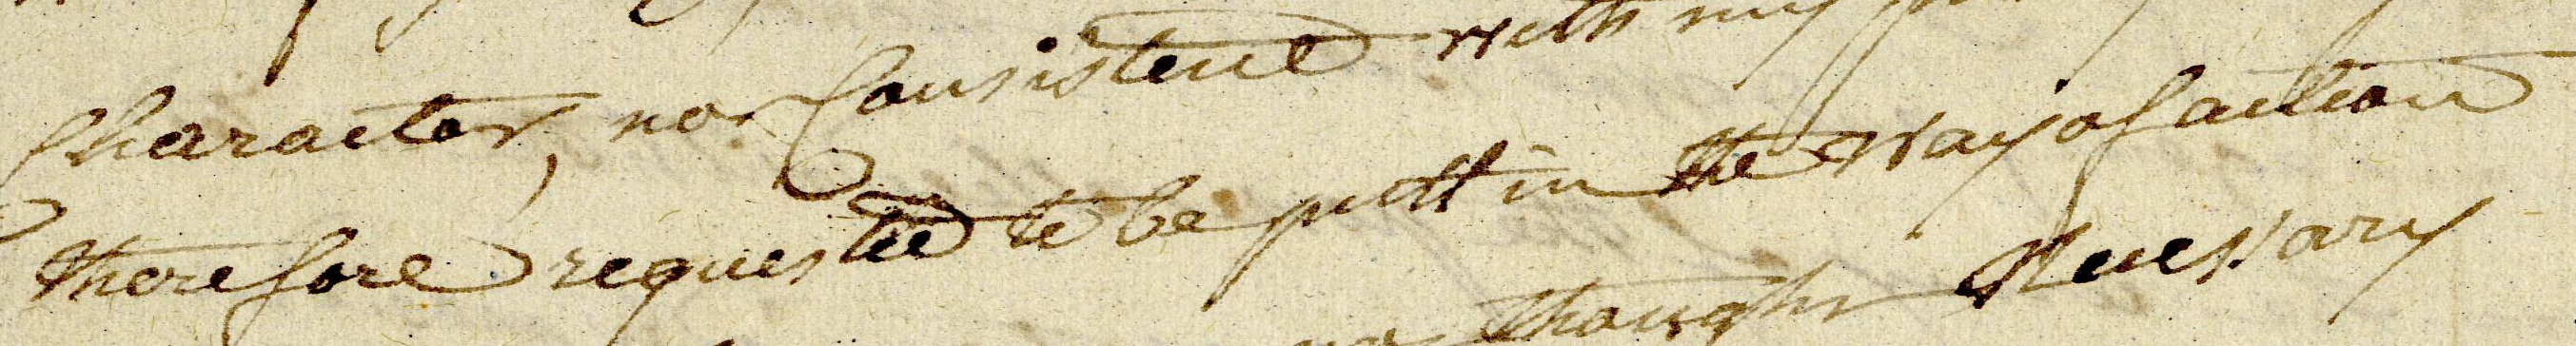therefore requested to be putt in the way of action
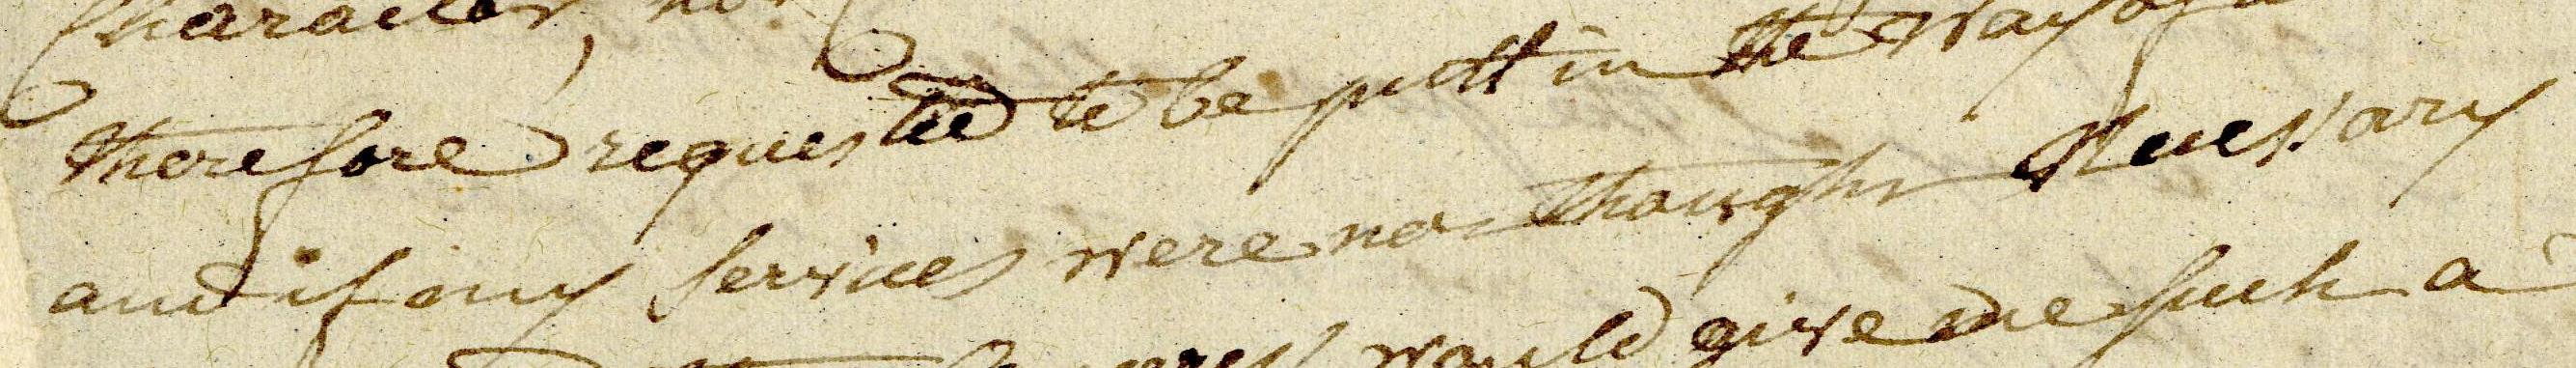and if any services were not thought necessary
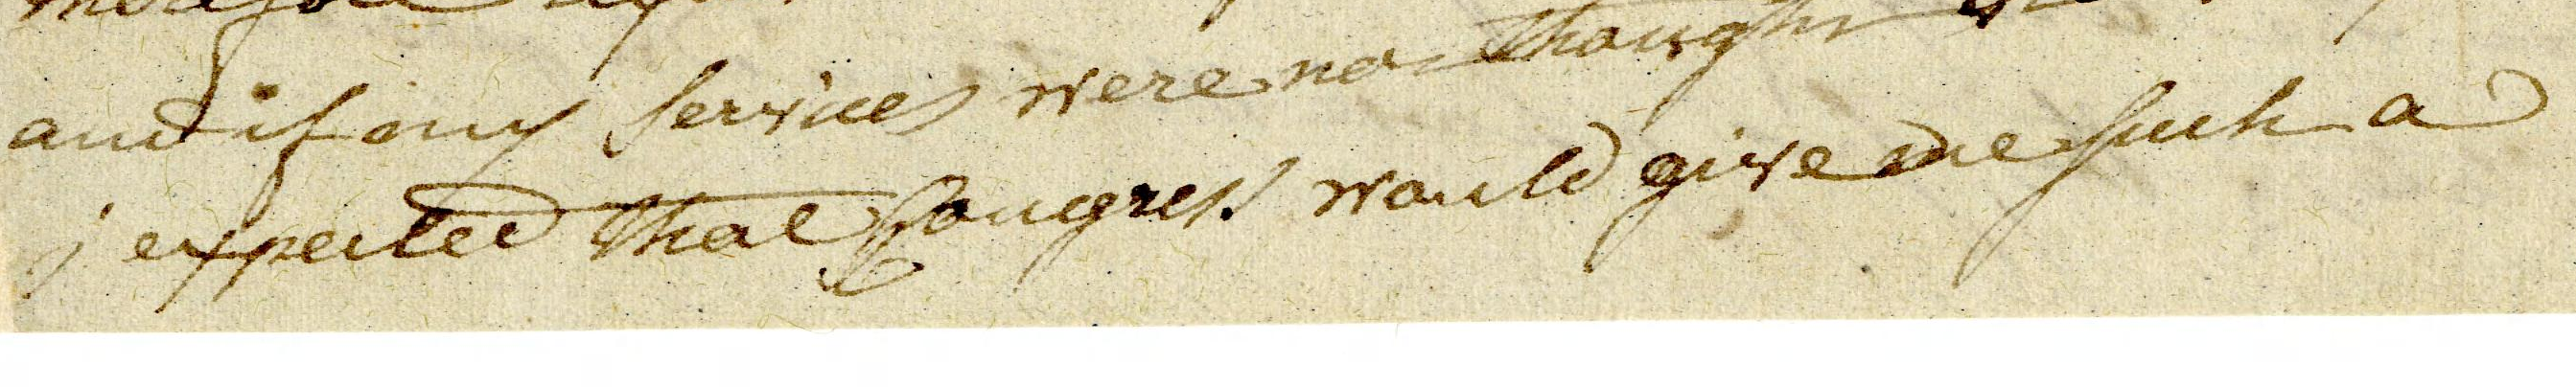I expected that Congress would give me such a
